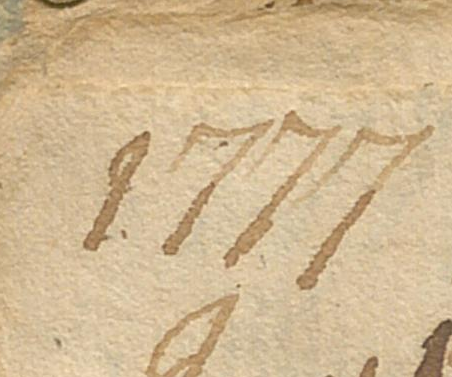1777
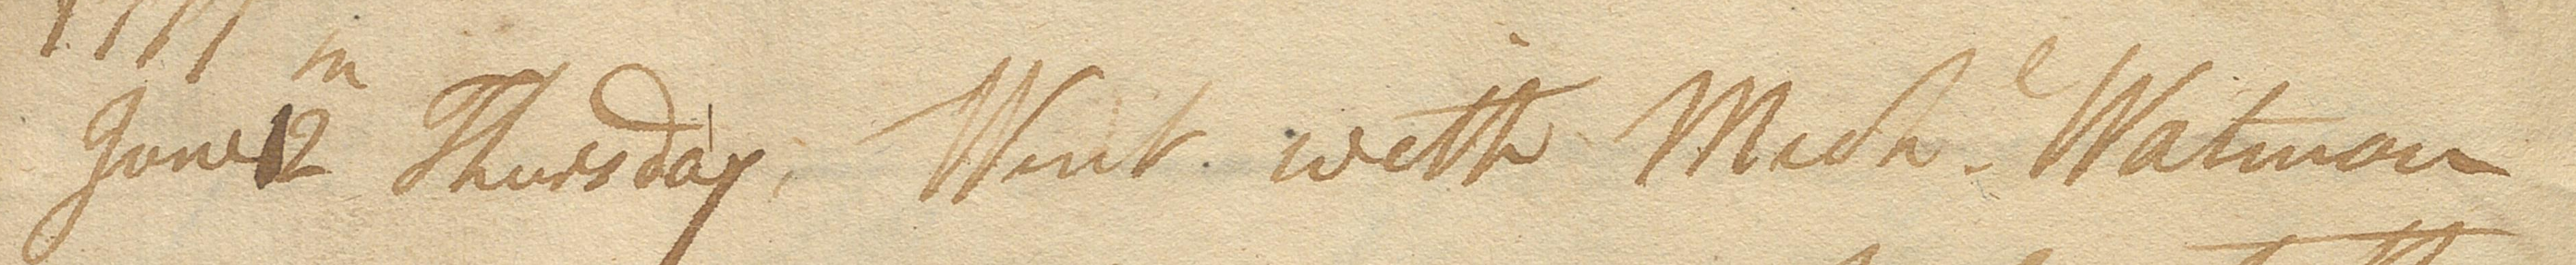June 12^th Thursday. Went with Mich^l. Watman
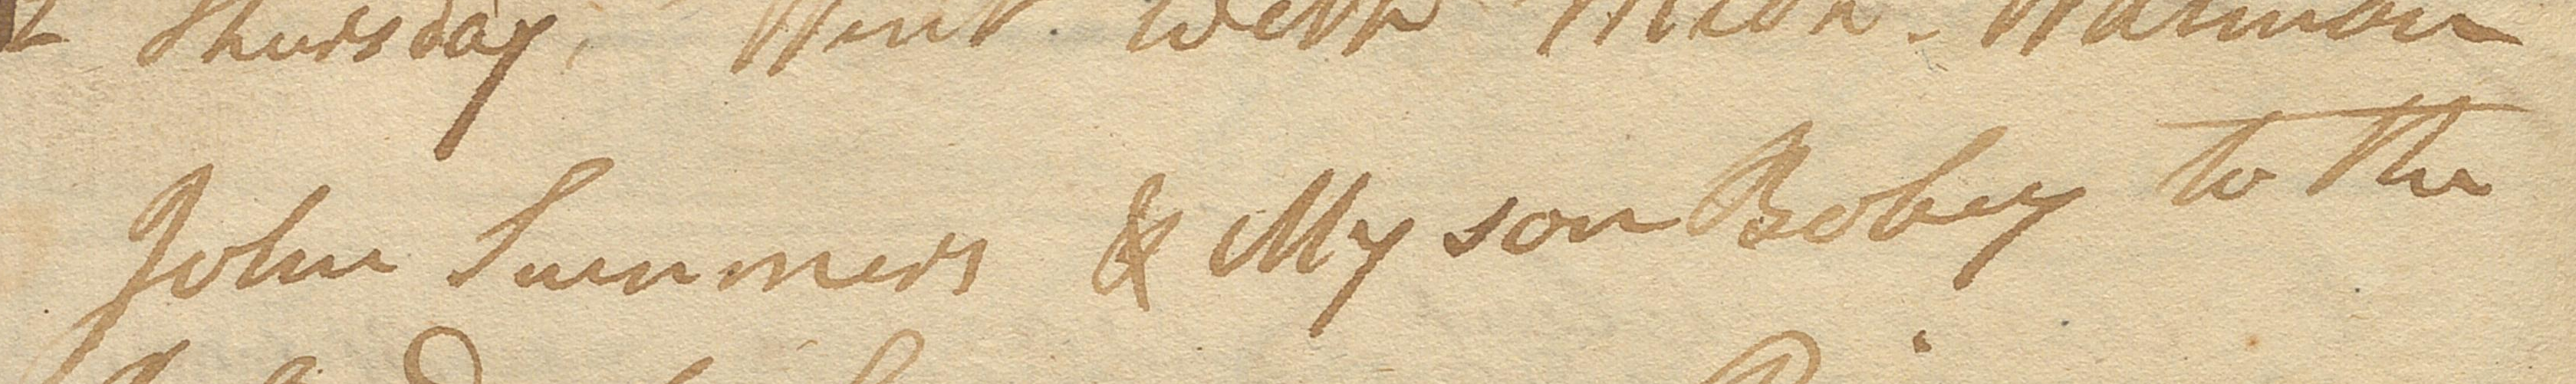John Summers & My son Bobey to the
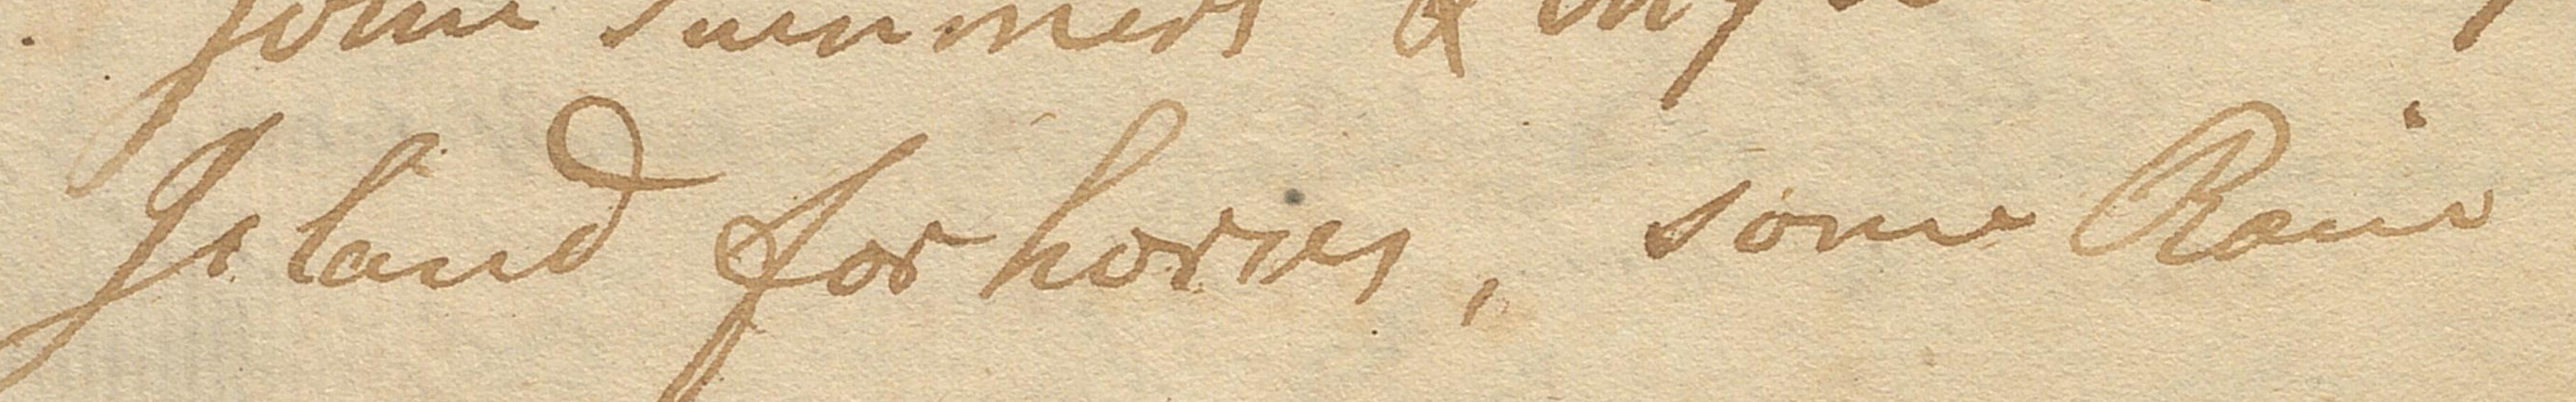Island for horses, some Rain
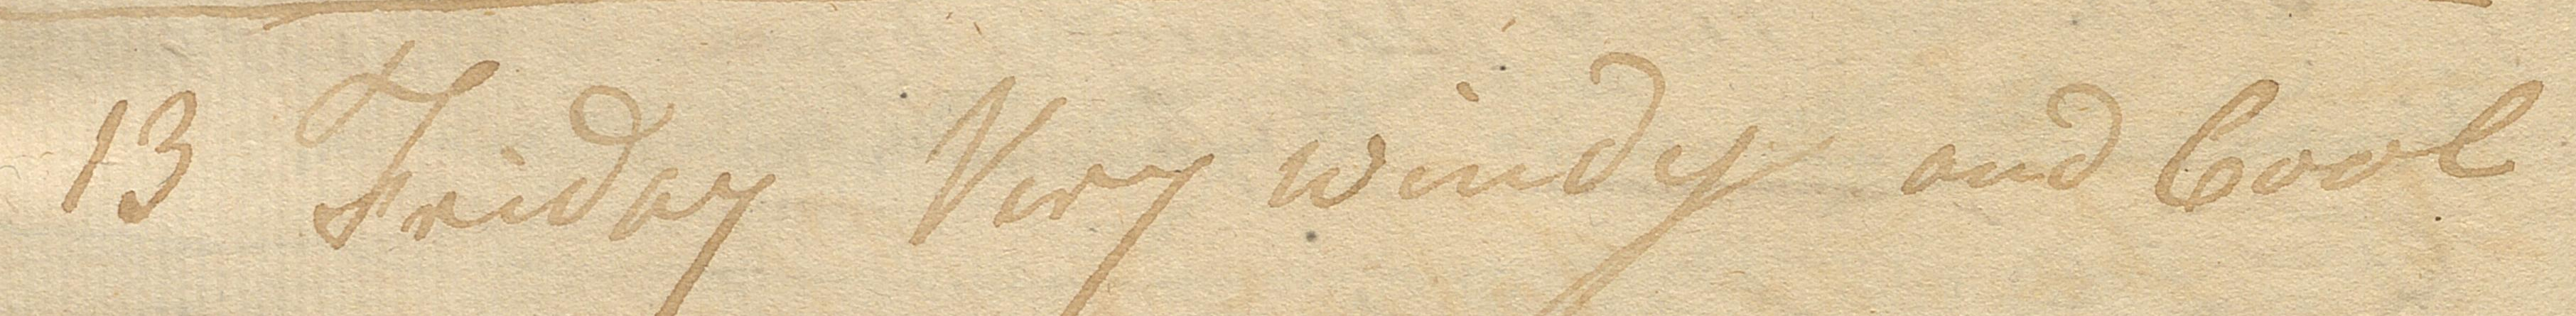13 Friday Very windy and Cool
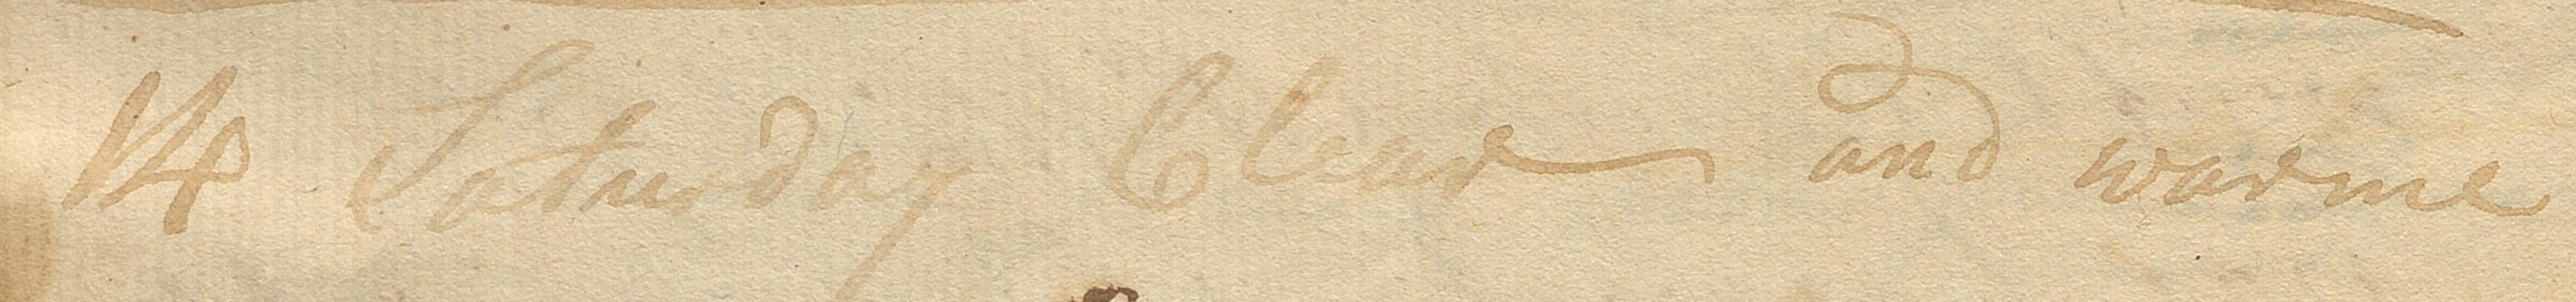14 Saturday Clear and warme
